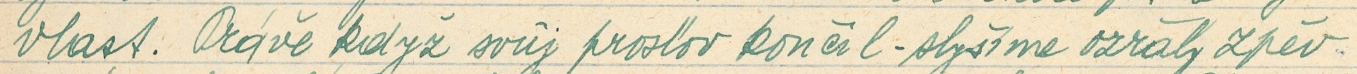vlast. Právě když svůj proslov končil - slyšíme ožralý zpěv.
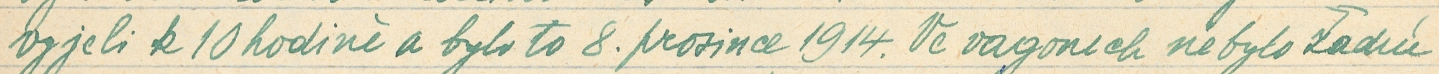vyjeli k 10 hodině a bylo to 8. prosince 1914. Ve vagonech nebylo žádné
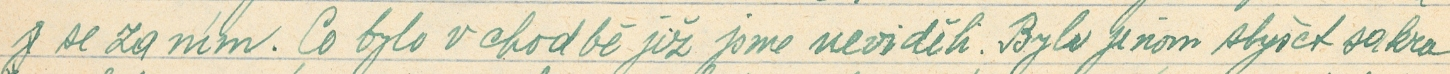j se za ním. Co bylo v chodbě již jsme neviděli. Bylo jenom slyšet sakra
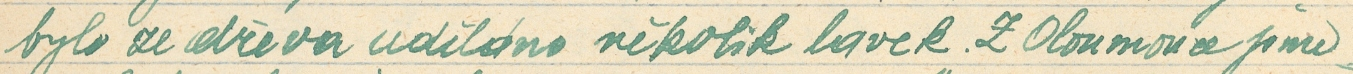bylo ze dřeva uděláno několik lavek. Z Olomouce jsme
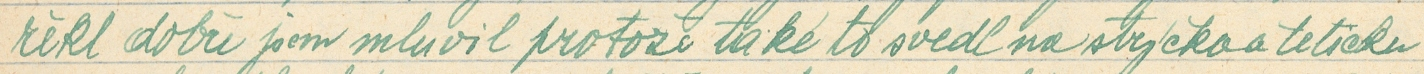řekl dobře jsem mluvil protože také to svedl na strýčka a tetičku
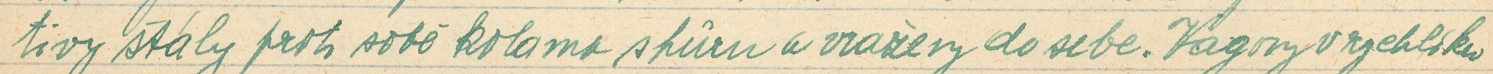tivy stály proti sobě kolama shůru a vraženy do sebe. Vagony v rychlíku
